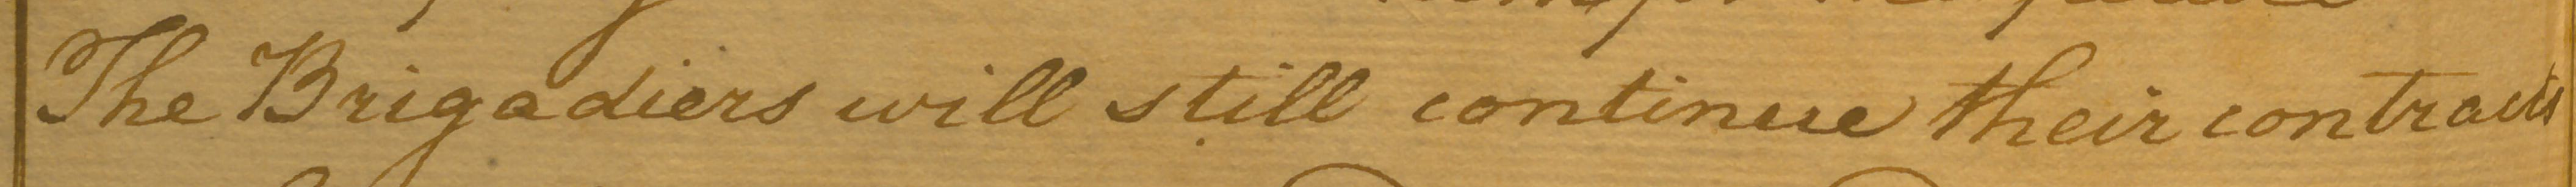The Brigadiers will still continue their contracts
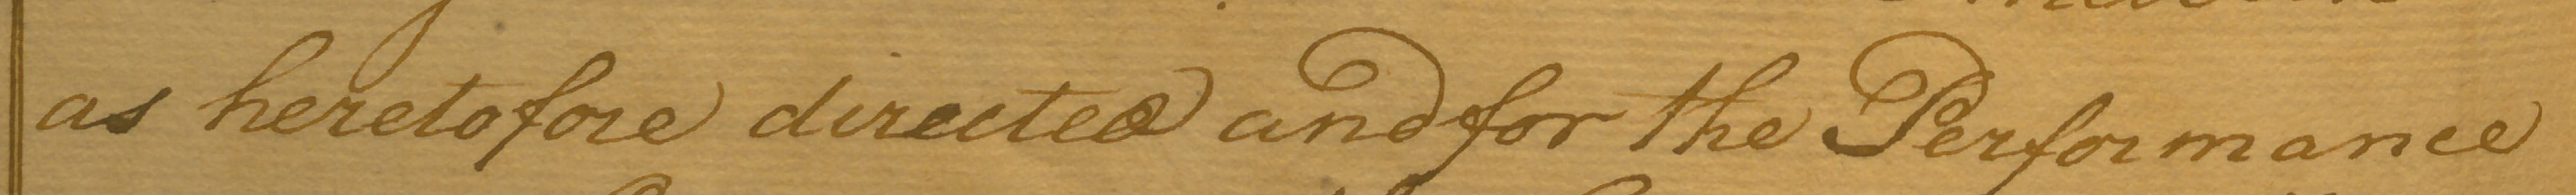as heretofore directed and for the Performance
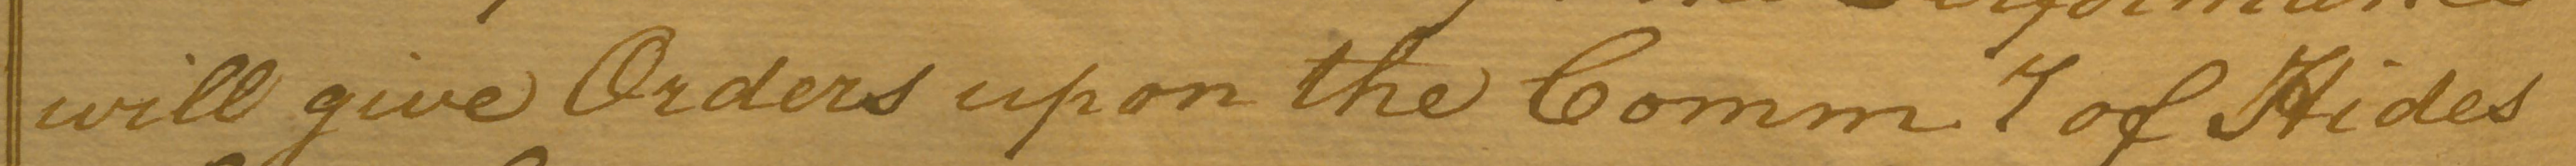will give Orders upon the Comm^y. of Hides
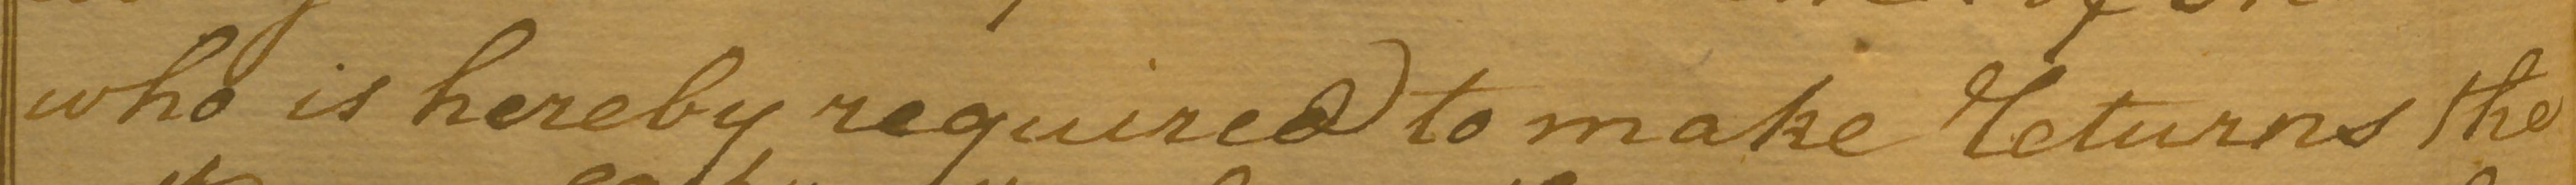who is hereby required to make returns the
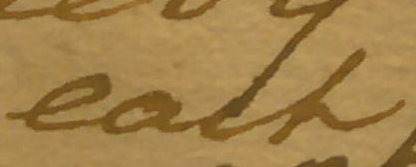each
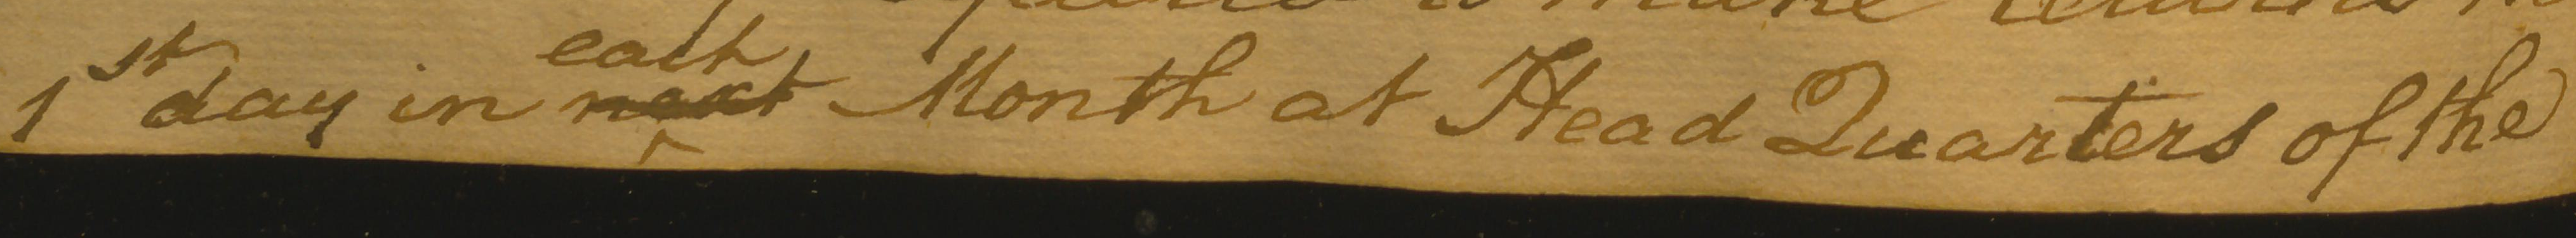1^st day in ^ [next] Month at Head Quarters of the
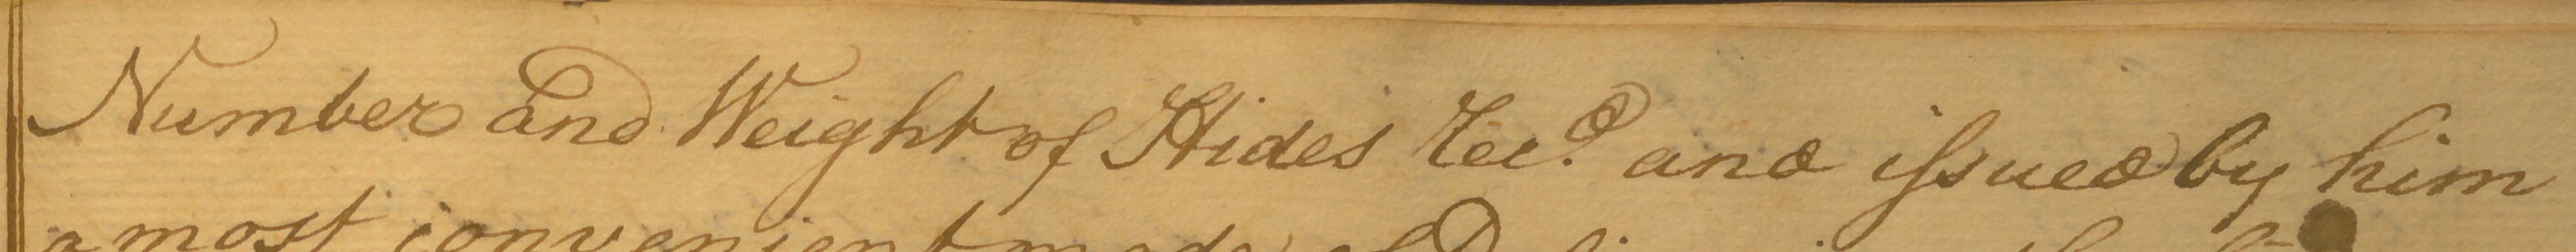Number and Weight of Hides rec^d. and issued by him
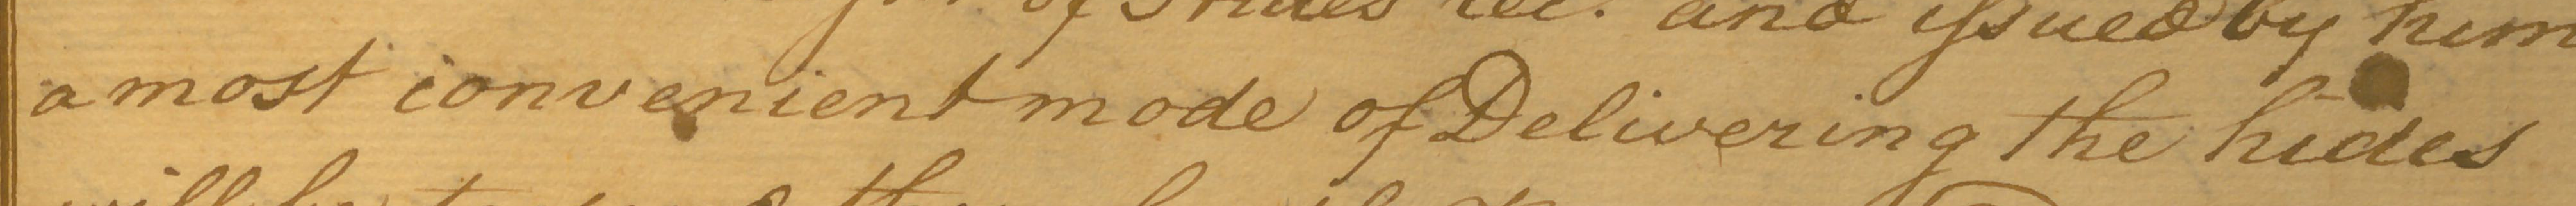a most convenient mode of Delivering the hides
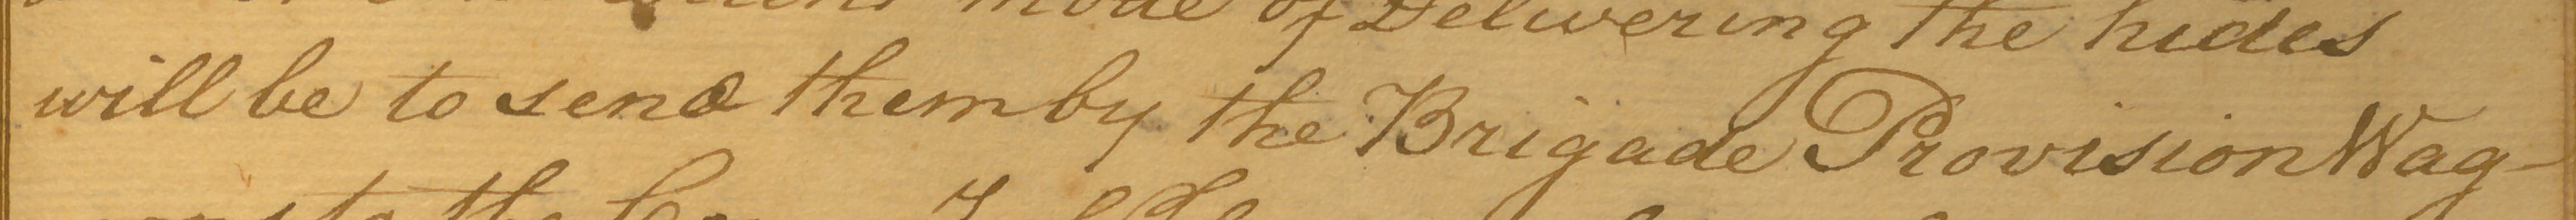will be to send them by the Brigade Provision Wag-
